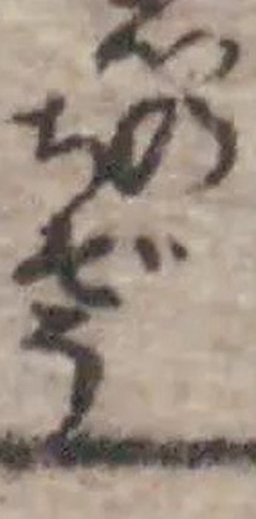ぢぞう
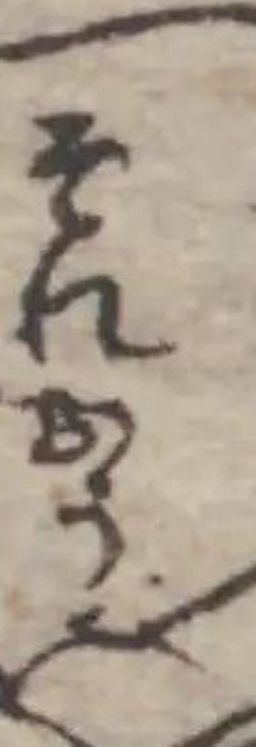それおう
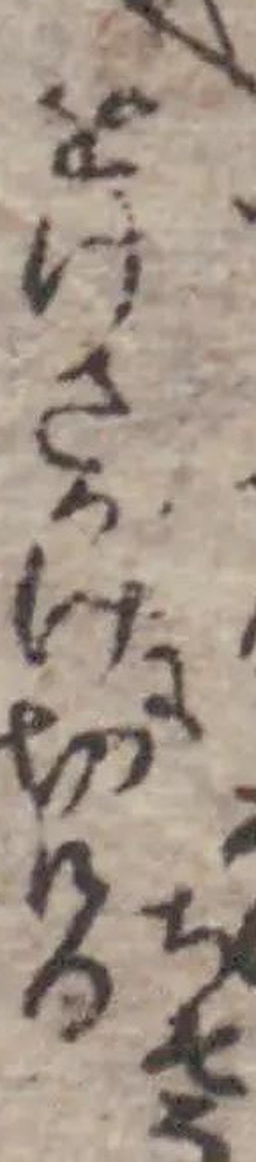をけさかけに切ける
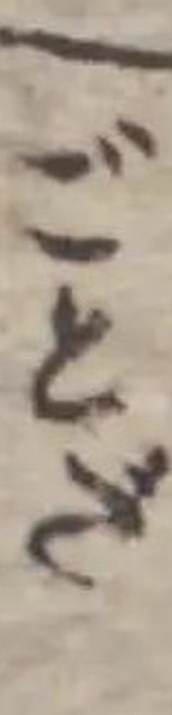ごとだ
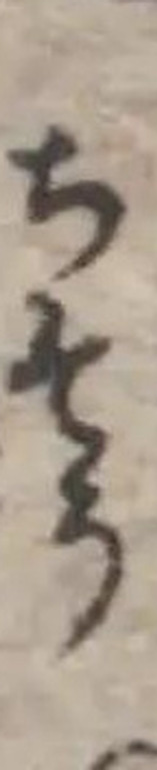ちそう
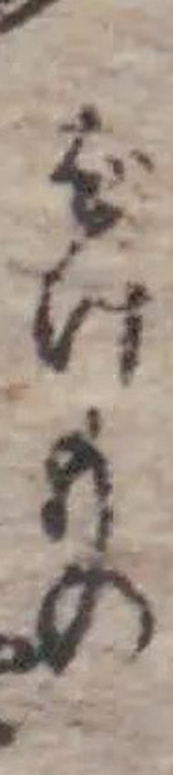ばけもの
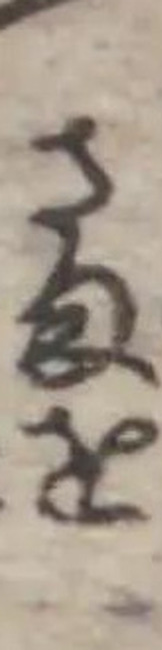さまを
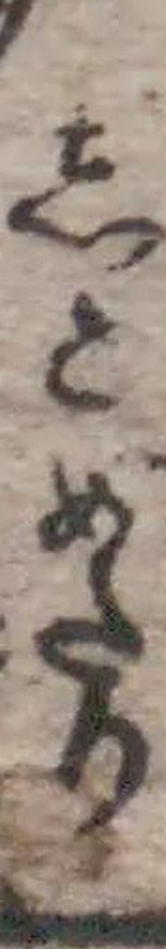しとめたり
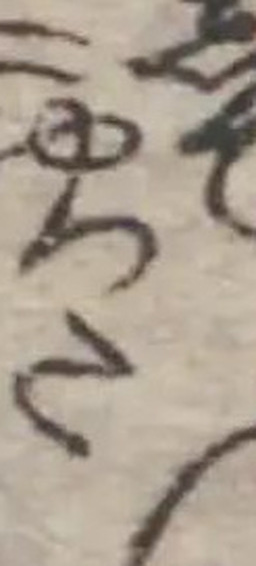やつた
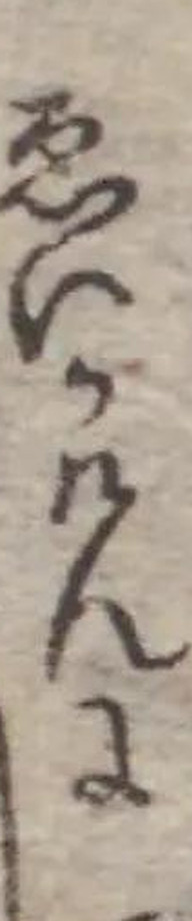ゑいかけんに
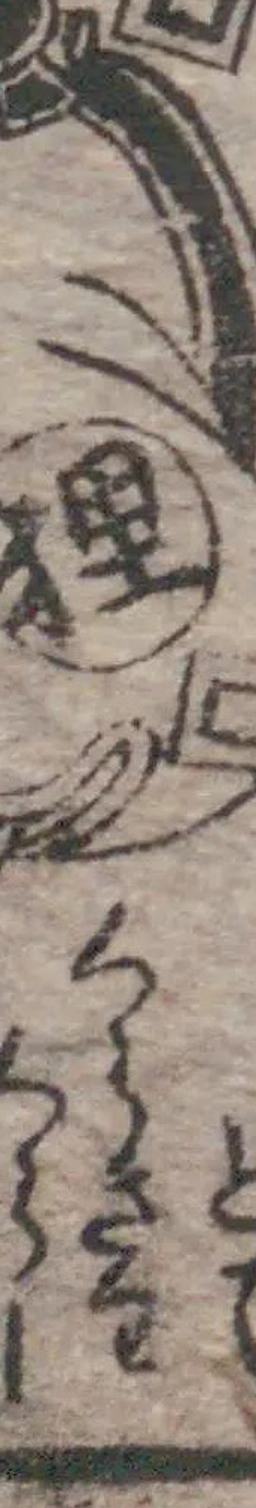くらきわ
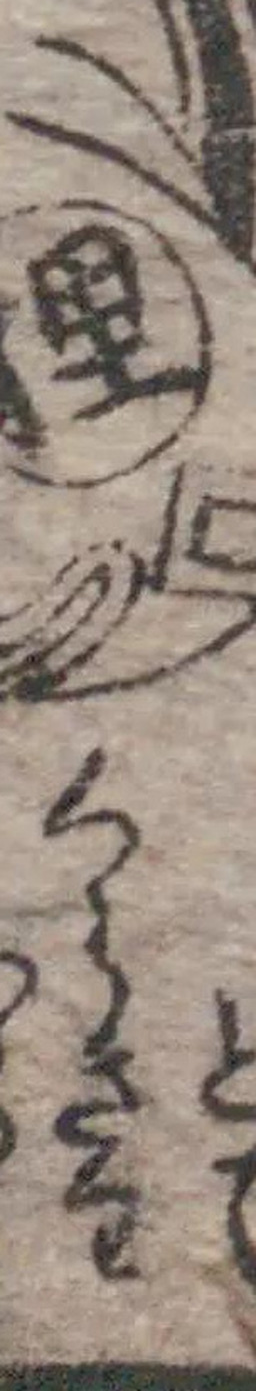くらきわ
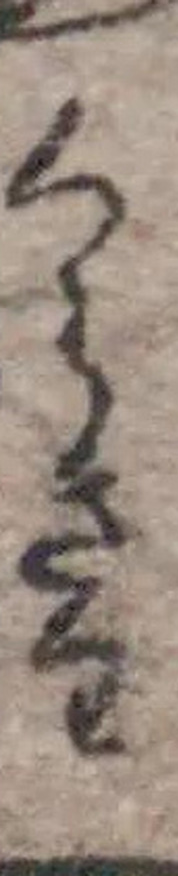くらきわ
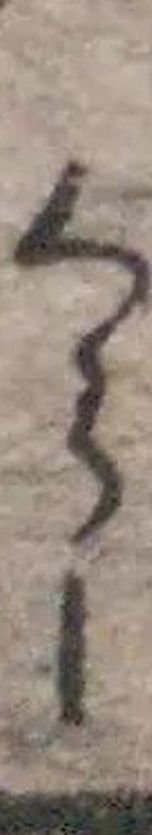くらし
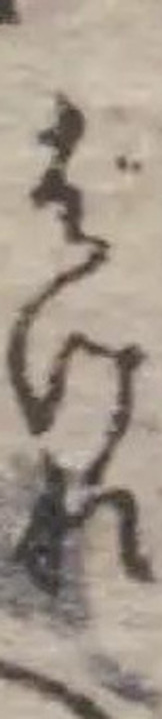ばけれ
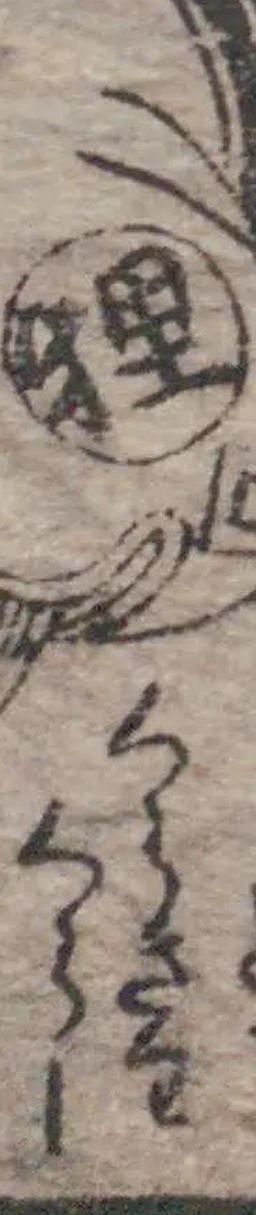くらきわ
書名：大磯地蔵咄 2巻
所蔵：国立国会図書館 National Diet Library, JAPAN
